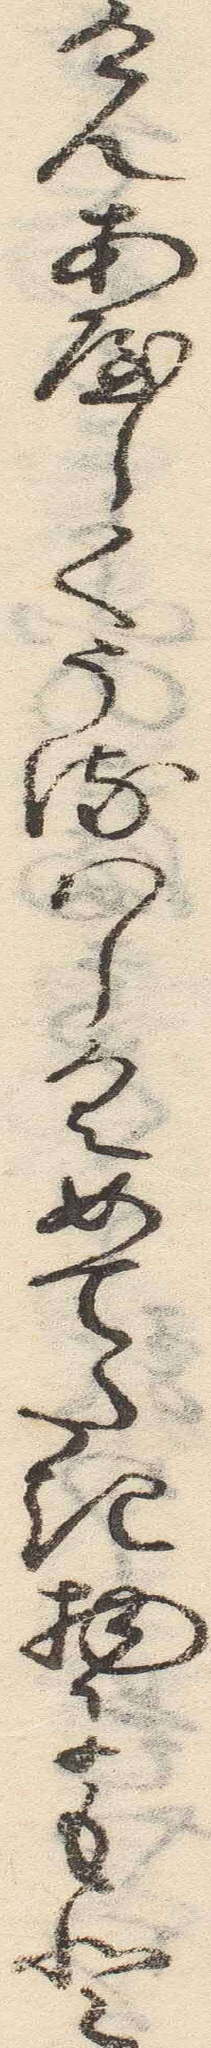けんあやしくうるはしくめてたき物にもと
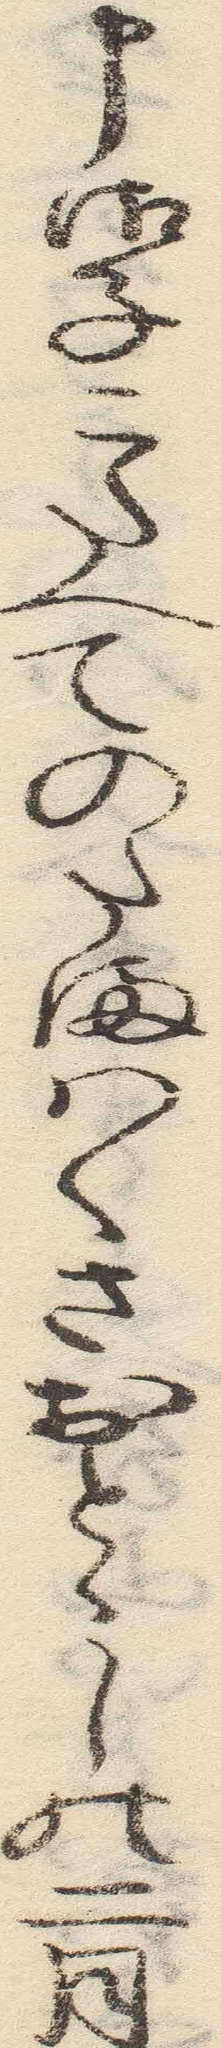申御子こたへてのたまはくさおとゝしの二月
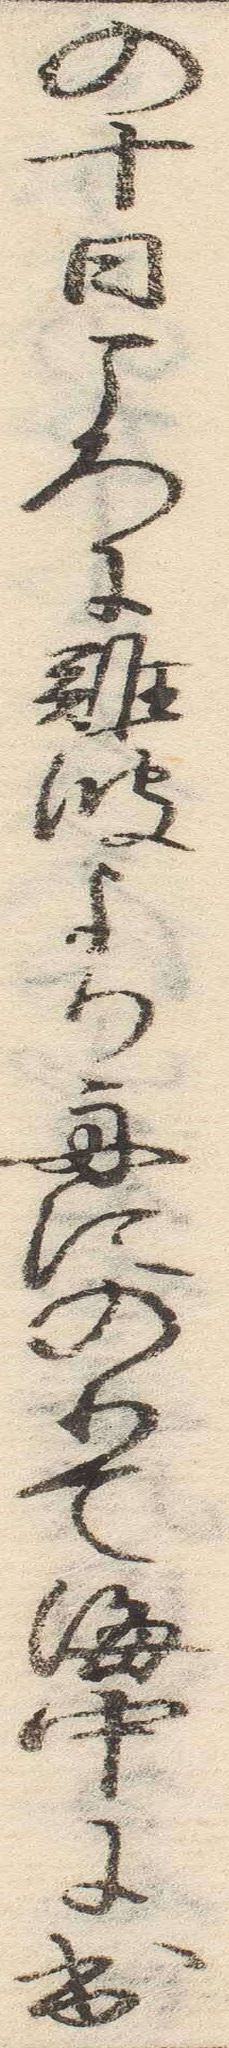の十日ころに難波より舟にのりて海中に出
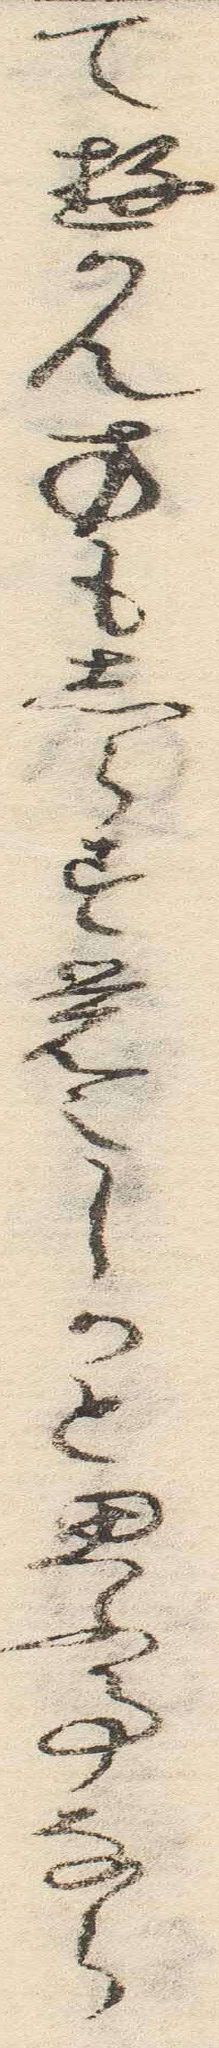てゆかん方もしらす覚えしかと思ふ事なら
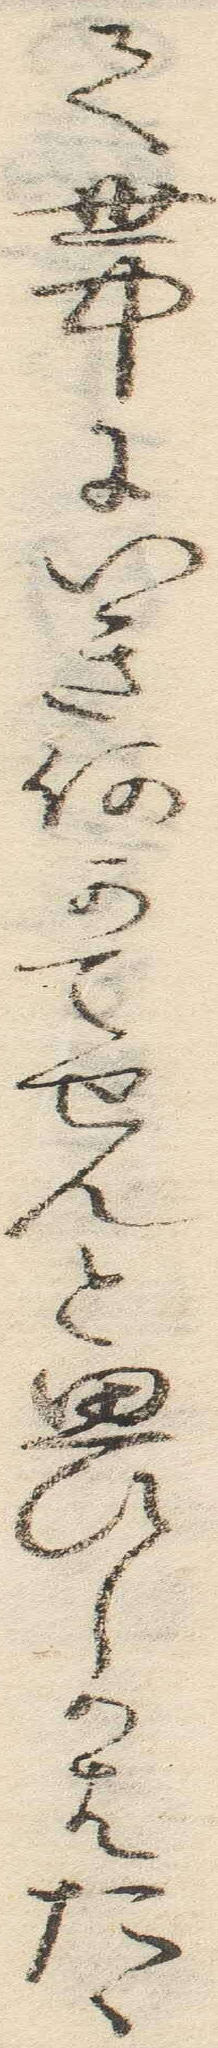て世中にいき何かてせんと思ひしかはたゝ
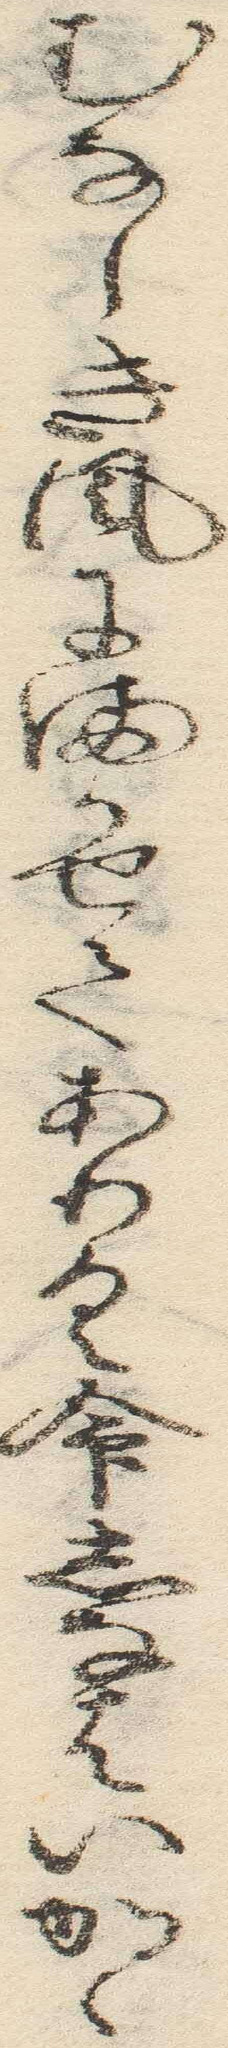むなしき風にまかせてありく命しなはいかゝ
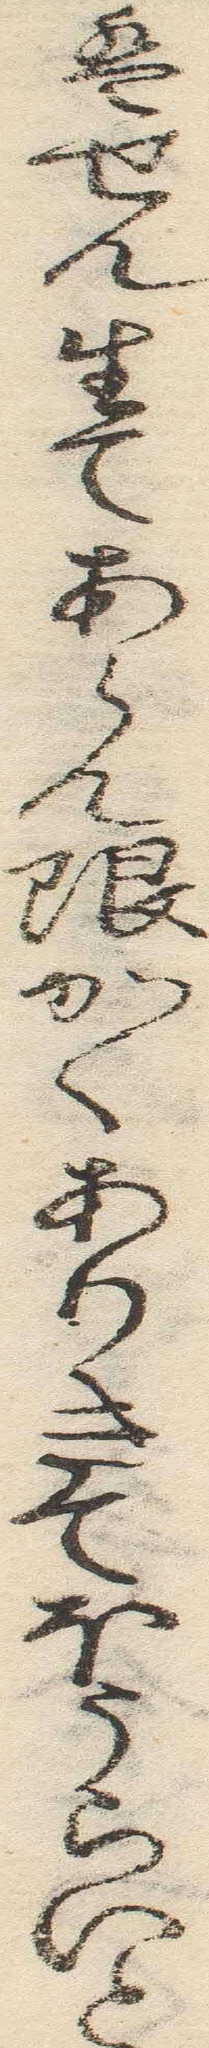はせん生てあらん限かくありきてほうらいと
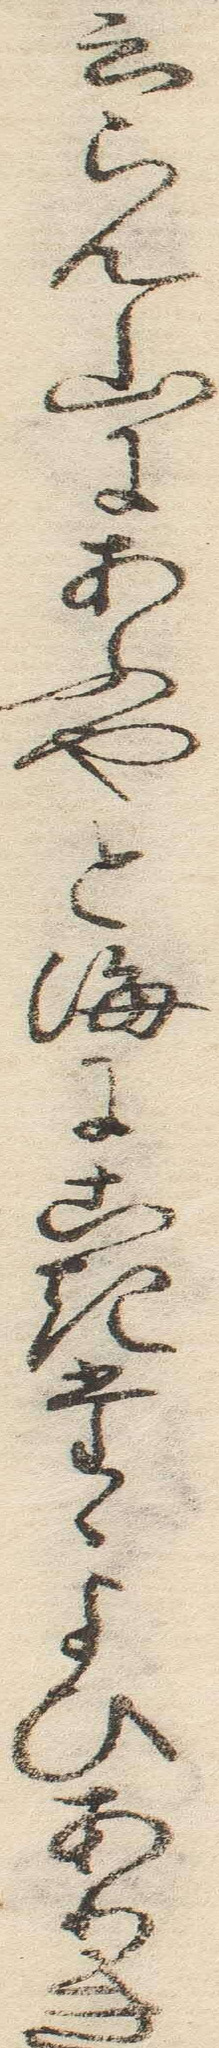云らん山にあふやと海にこきたゝよひありき
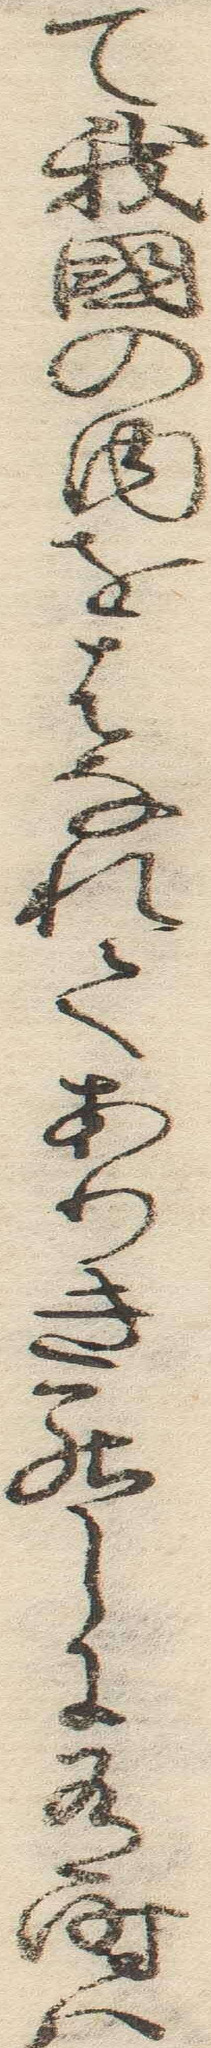て我国の内をはなれてありき罷しに有時は
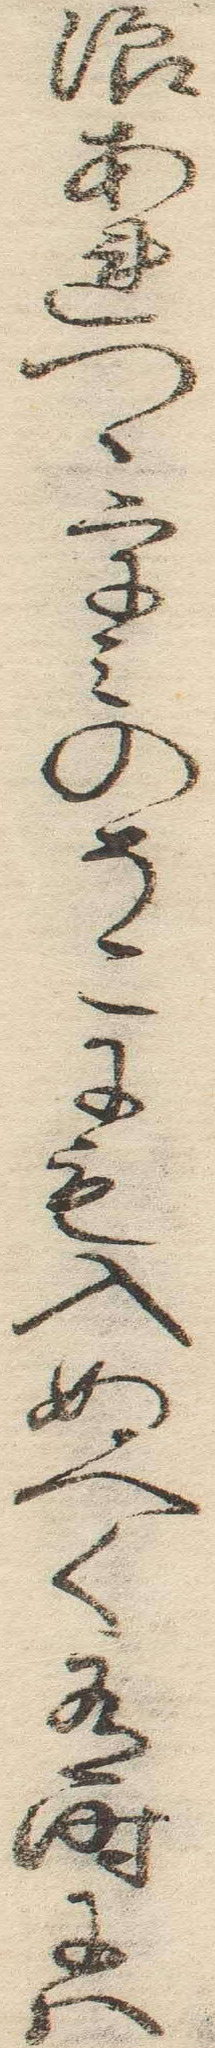浪あれつゝうみのそこにも入ぬへく有時には
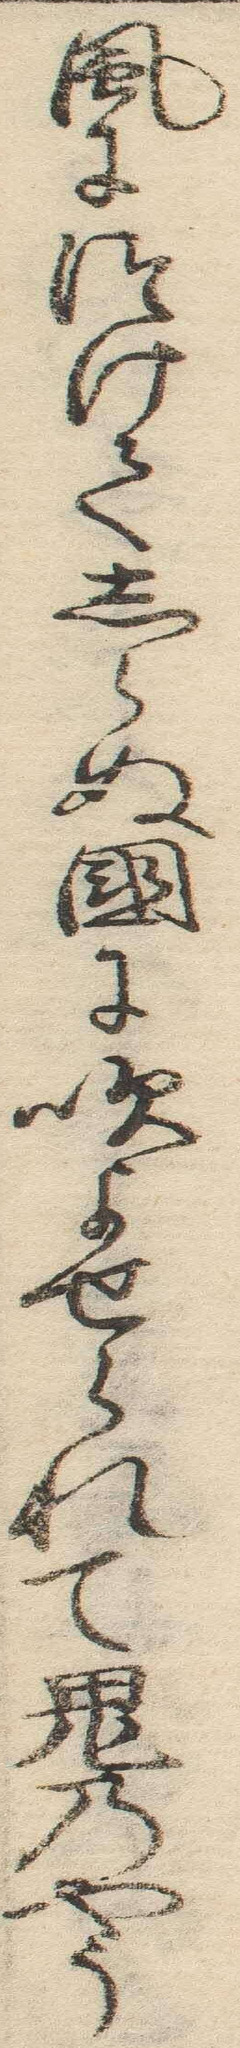風につけてしらぬ国に吹よせられて鬼のやう

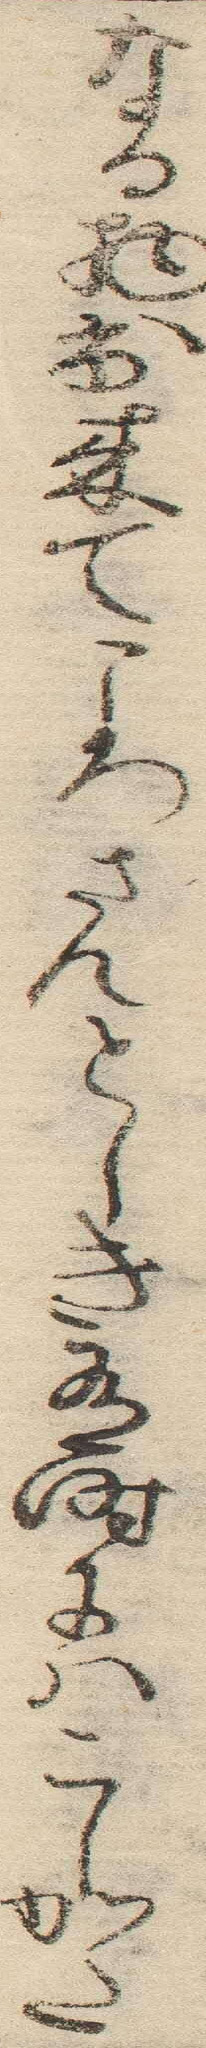なる物出来てころさんとしき有時にはこしかた
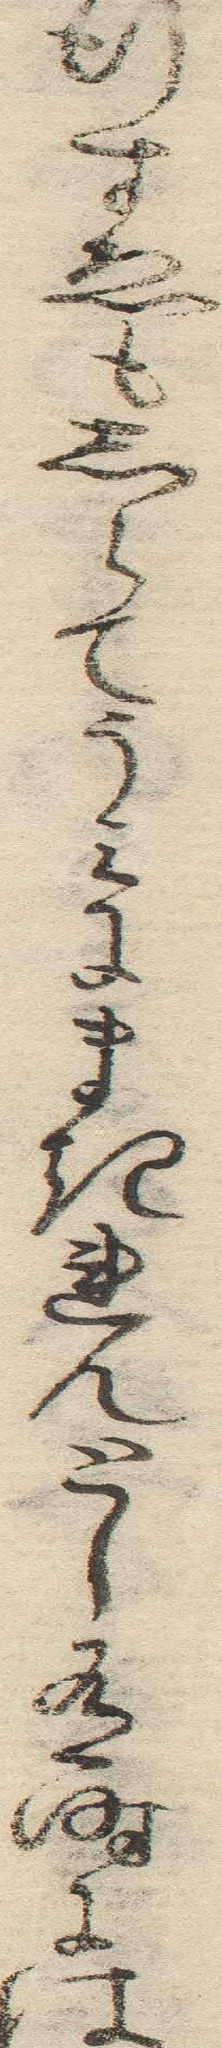行すゑもしらてうみにまきれんとし有時には
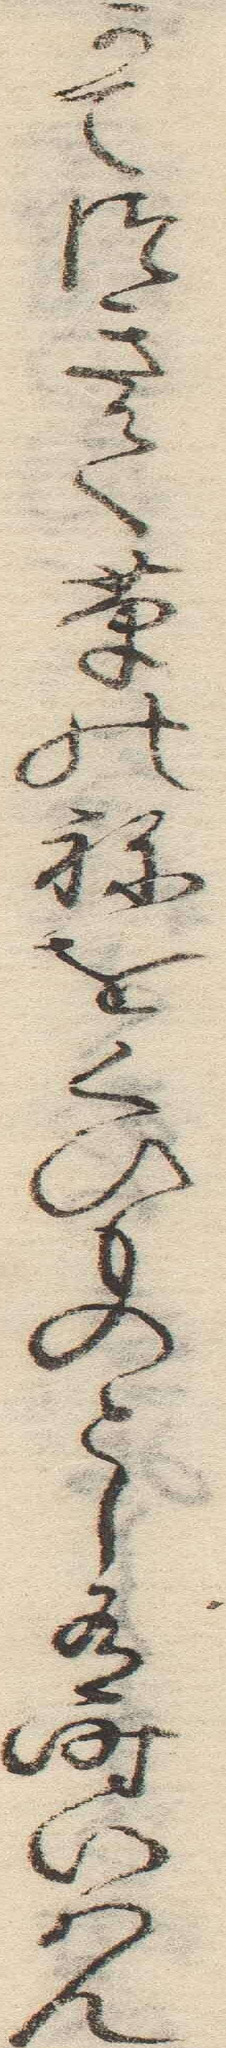かてつきて草のねをくひものとし有時いはん
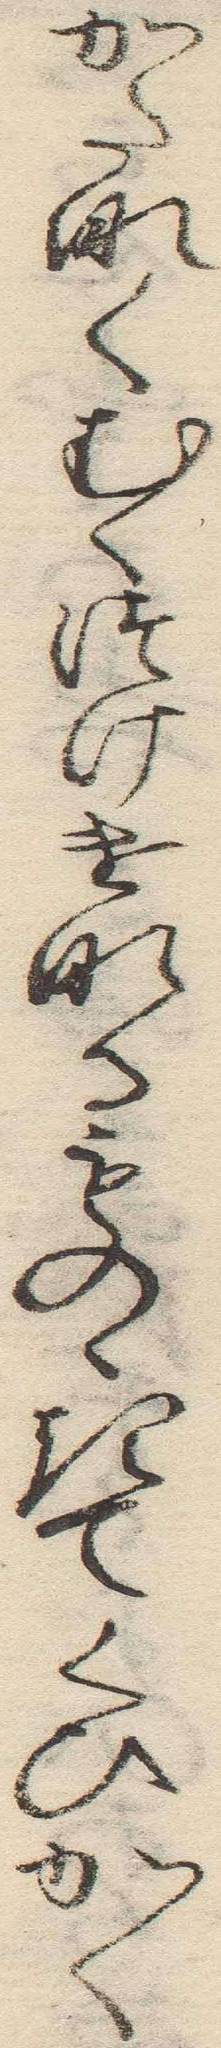かたなくむくつけけなるものゝきてくひかく
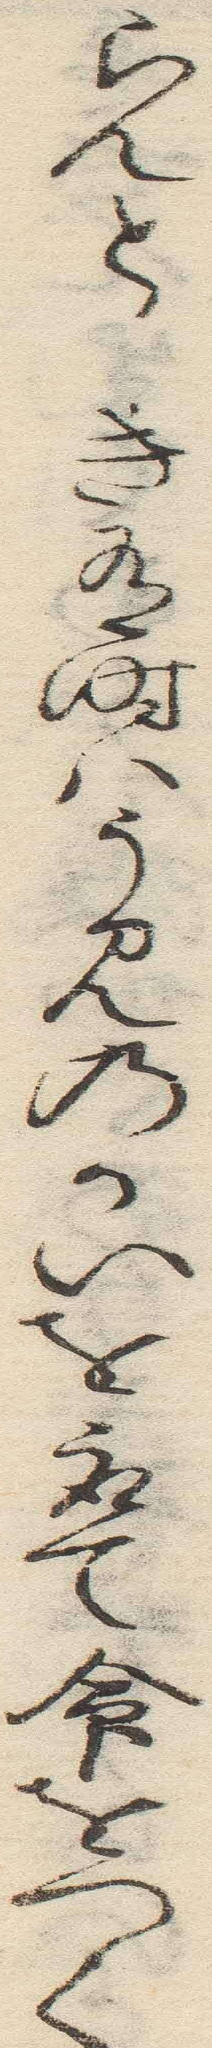らんとしき有時はうみのかいを取て命をつく
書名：竹取物語
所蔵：東京学芸大学附属図書館 国文学研究資料館
